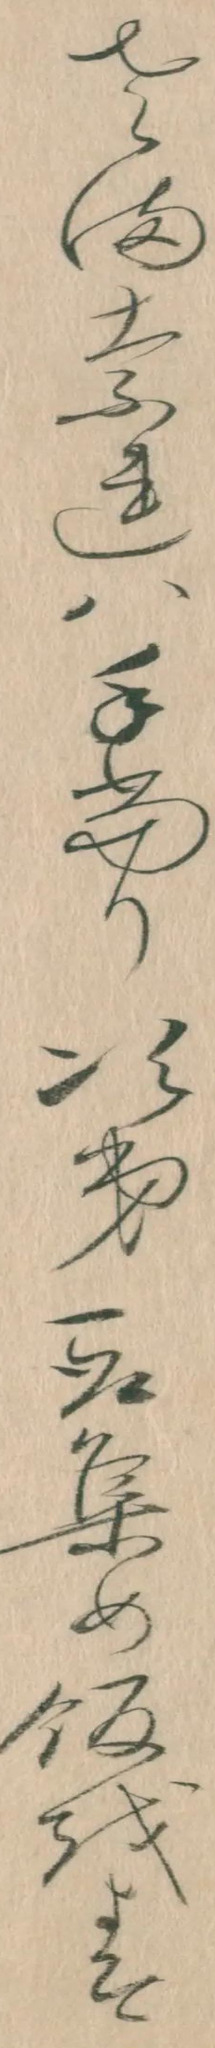さまなれは手当り次第取集め飯をよそ
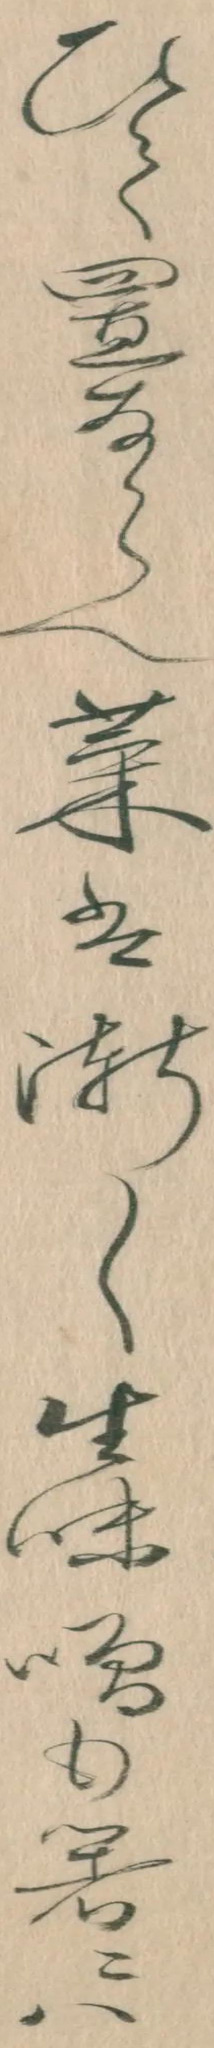ひて置ならへ菜は漸く生味噌も箸には
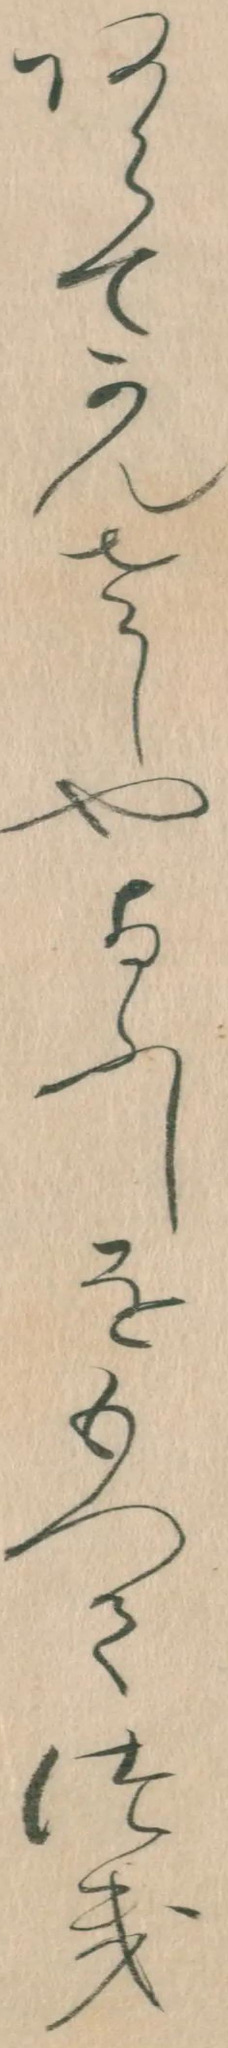あらてかんさしやよふしをもつてつき
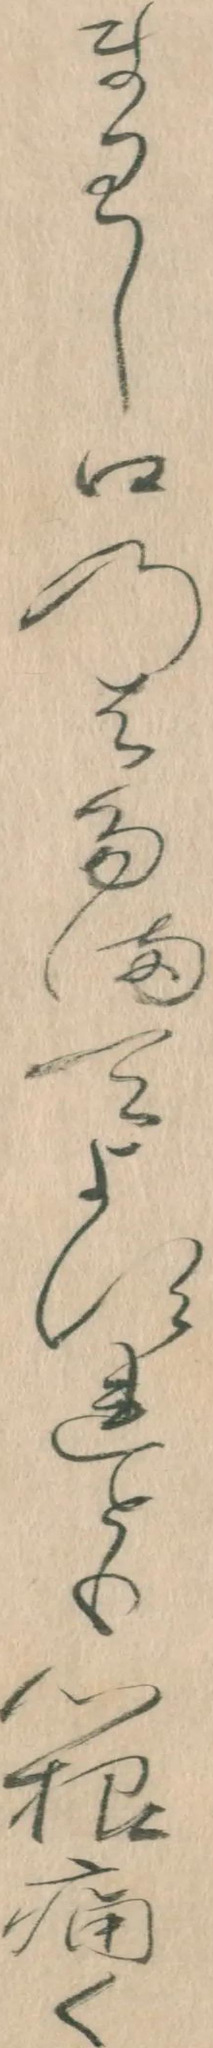まわし口のはたまてよすれとも心根痛く
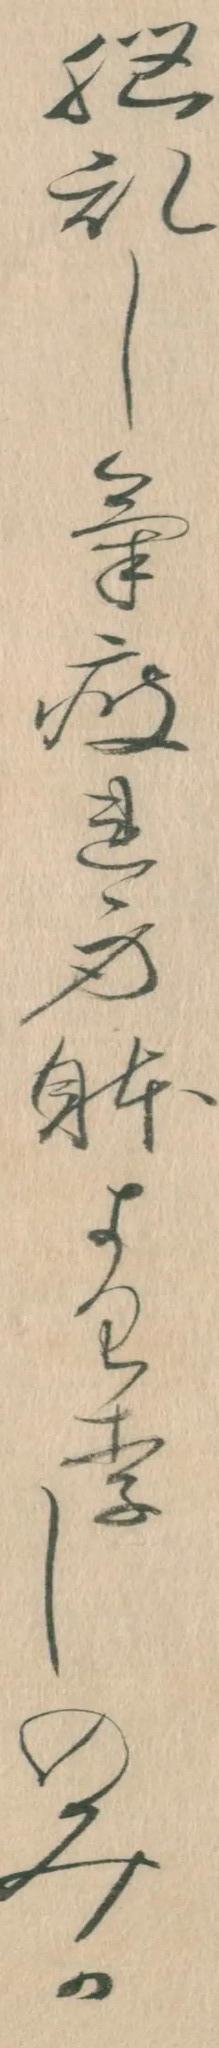脳乱し気疲れ身体よわりしのみか
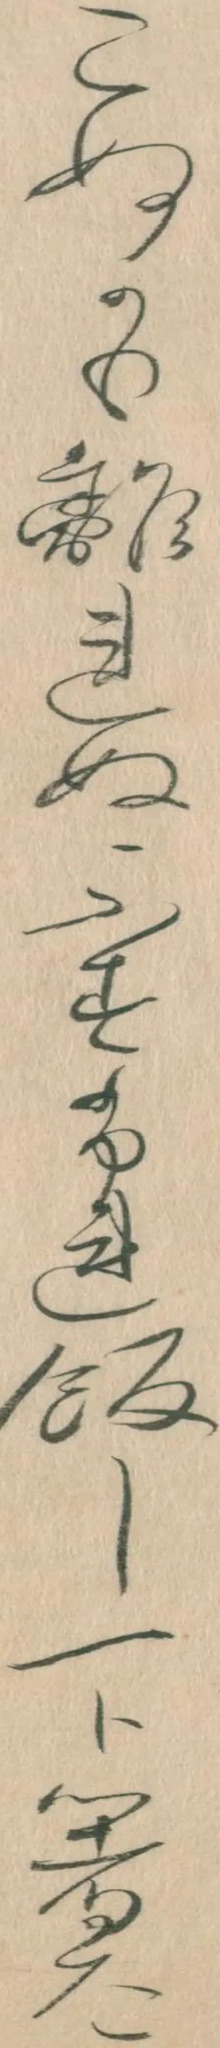こぬかも離れぬふすふれ飯し一ト箸た
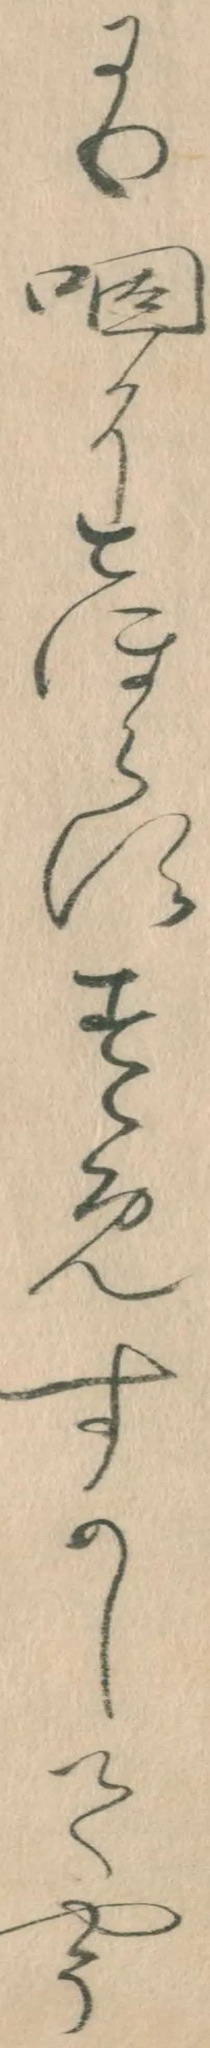にも咽にとほらすすゝめすかしてやう

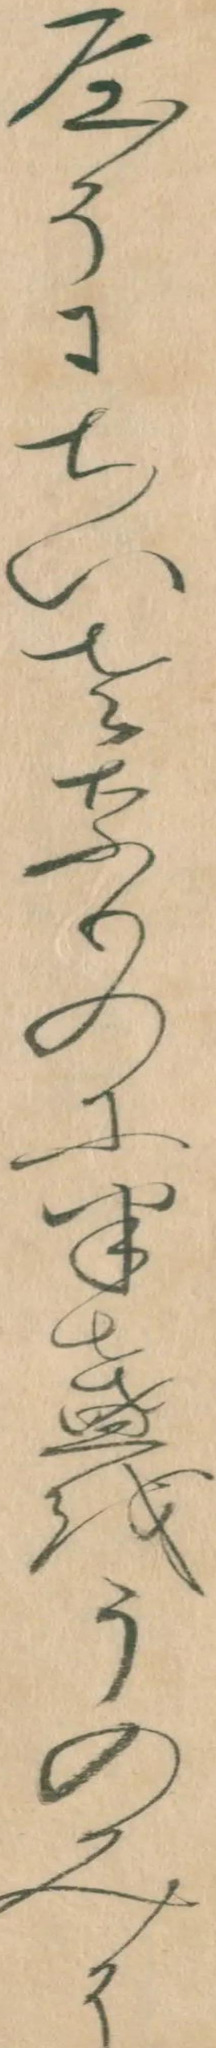やうにちいさなものに半盞をうのみに
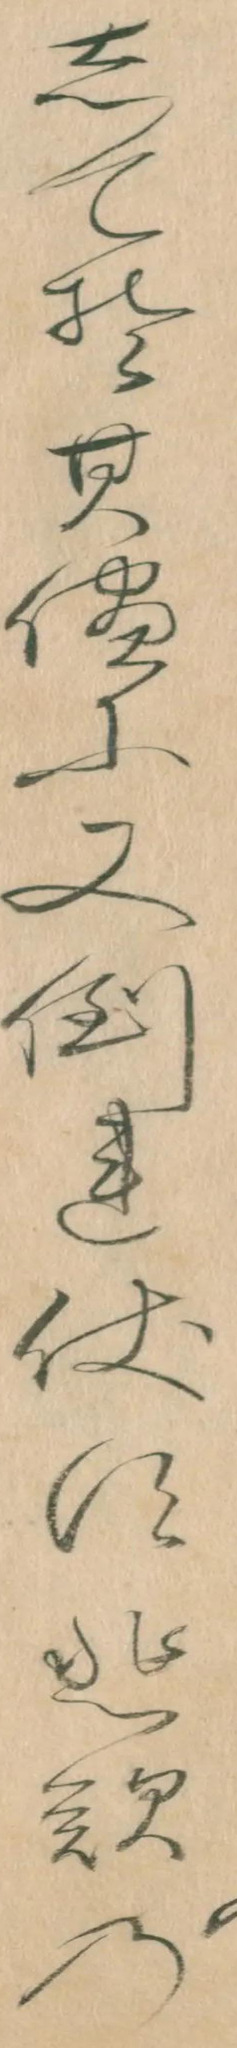してそ其儘に又倒れ伏す悲歎の
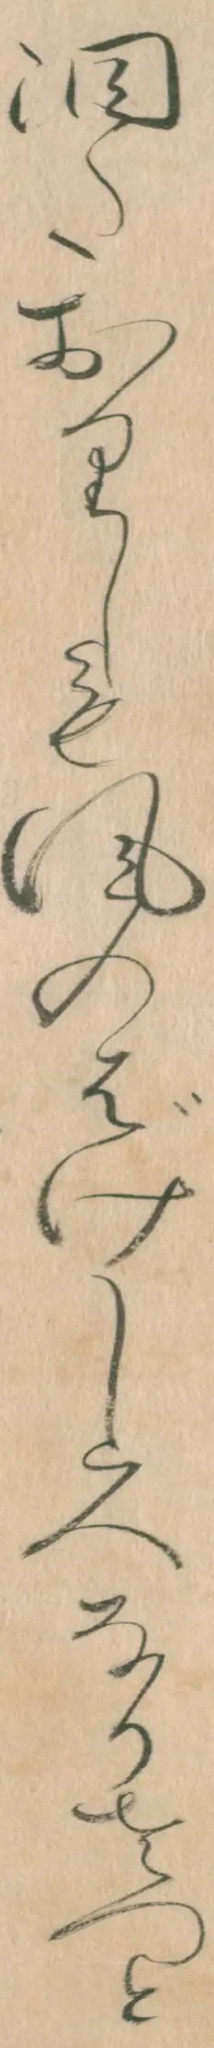泪たおりしも風のはけしくなりさつと
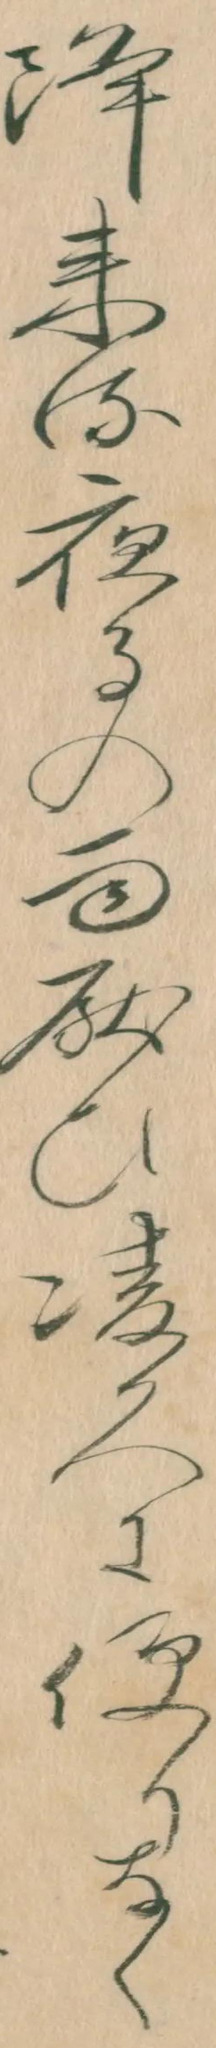降来る夜るの雨厭ひ凌くに便りなく
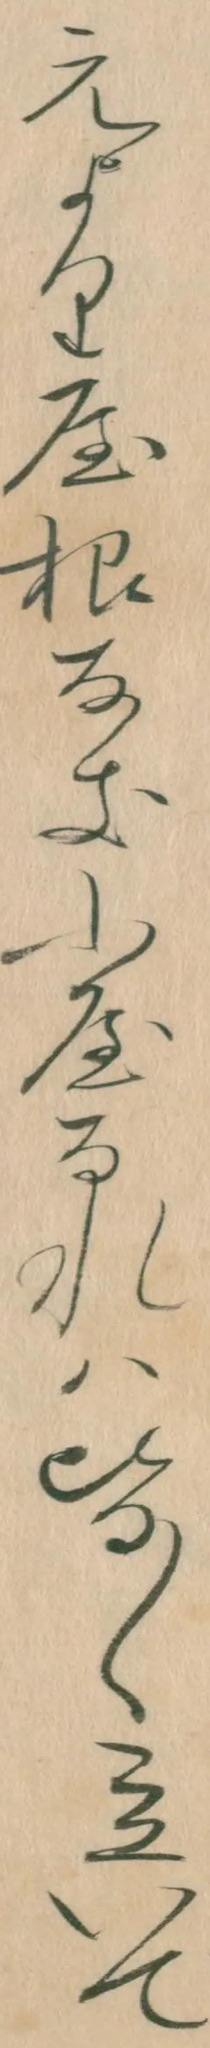元より屋根なき小屋なれは皆〳〵立いで
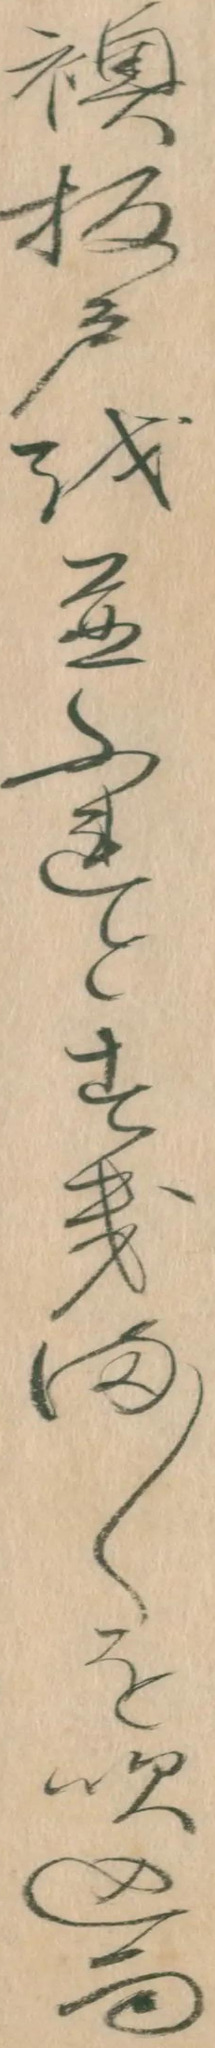襖板戸を並ふれとすきま〳〵を吹込雨
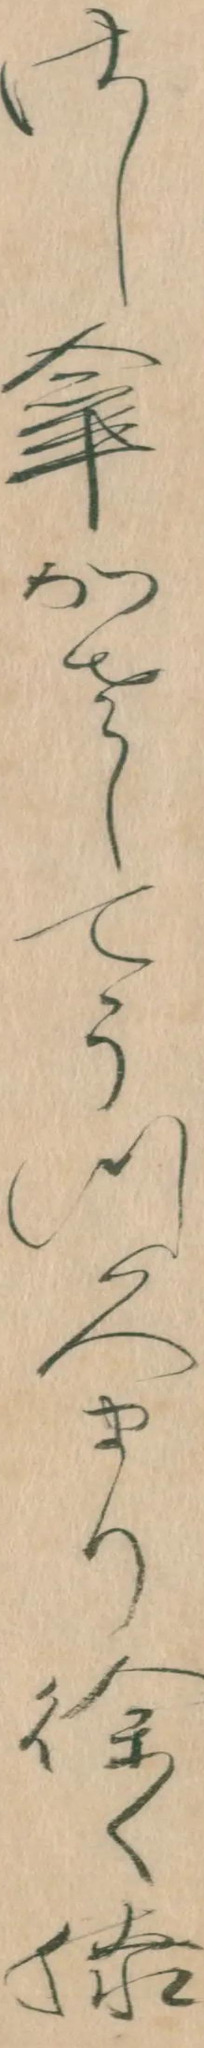さし傘かさしてうつくまり徐く膝
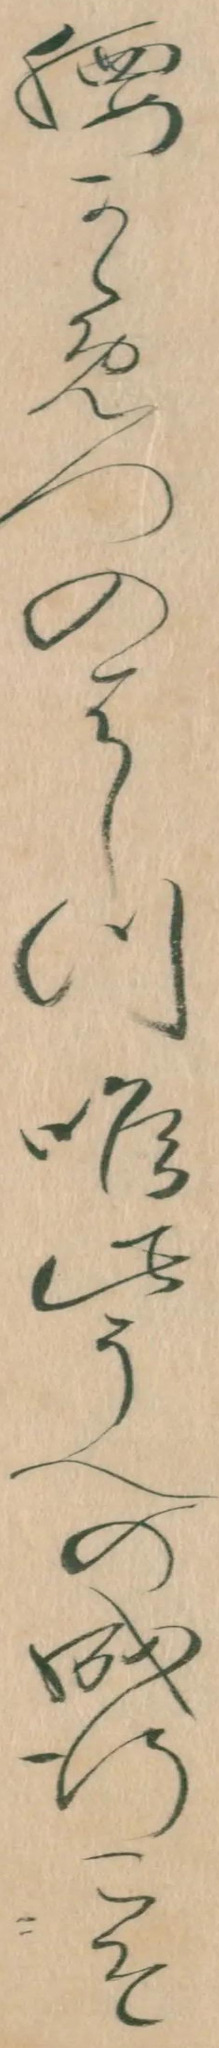腰かゝめつのはしつ唯此うへの成行こそ
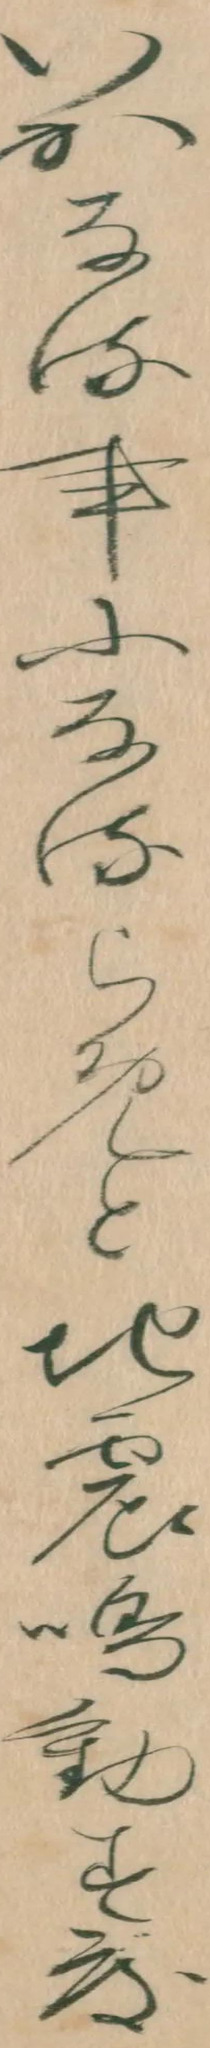いかなる事になるらめと地震鳴動す度
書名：俗語之種. [5]
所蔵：国立国会図書館 National Diet Library, JAPAN
